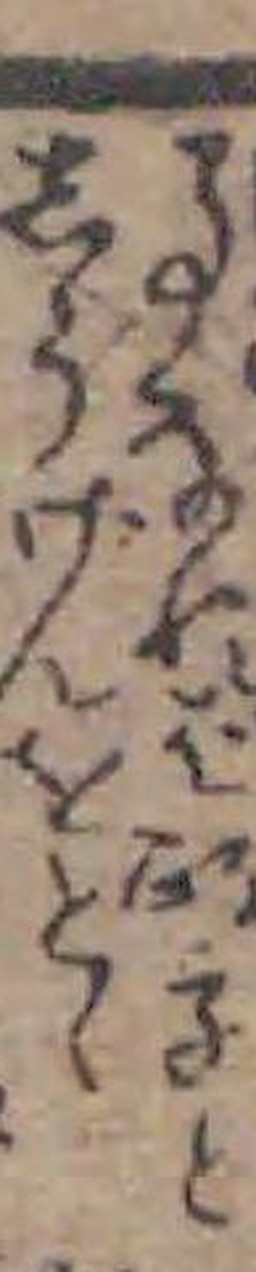しうげんをとゝ
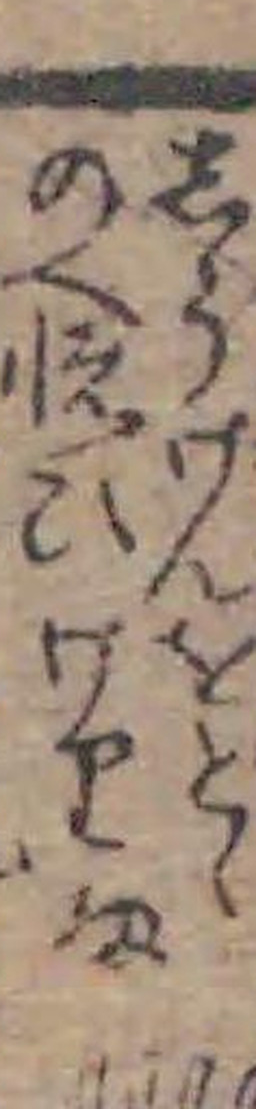のへ悦ひけり扨
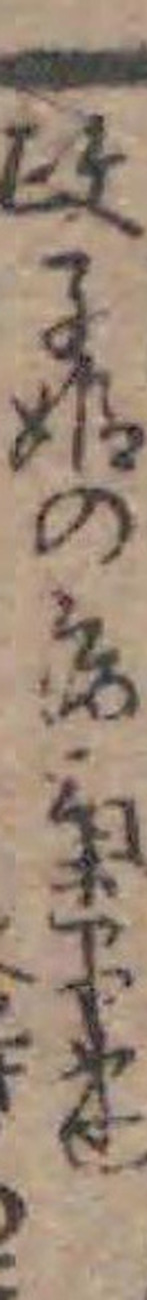政子姫の病気早速
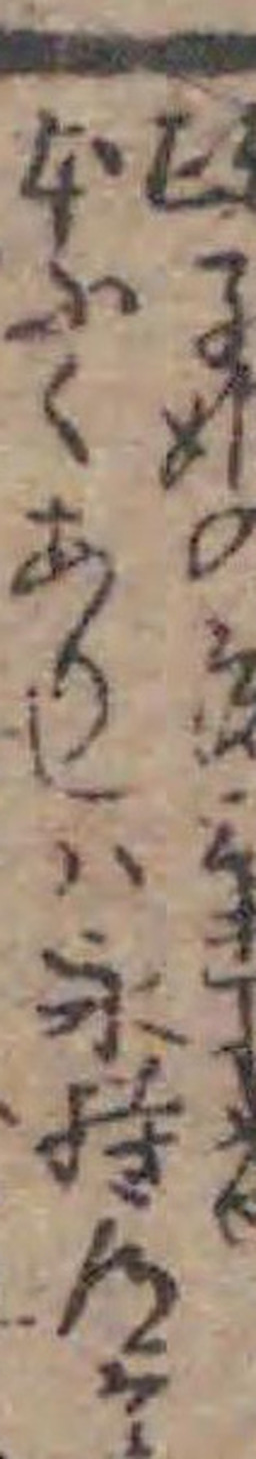本ふくありしは永持道意が
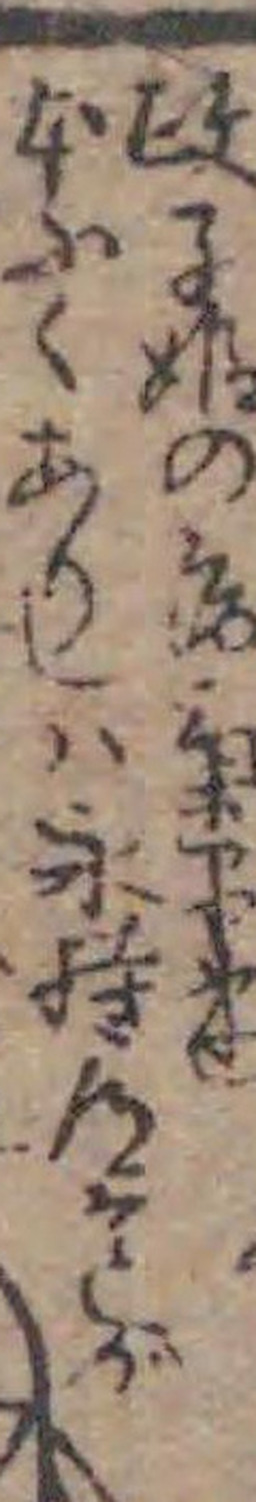本ふくありしは永持道意が
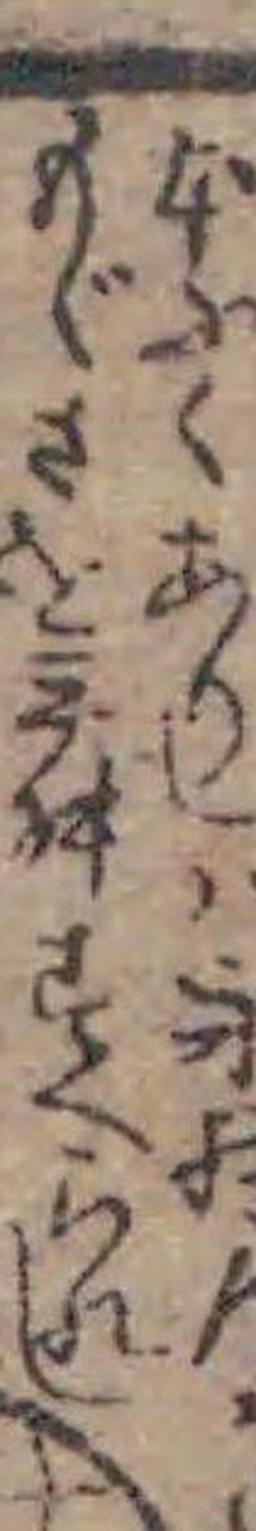もぐさを三舛すへられし
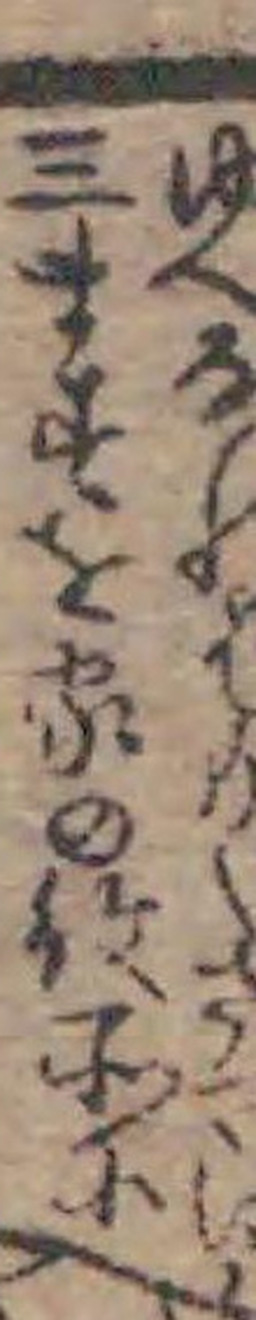三ますを家の紋所に
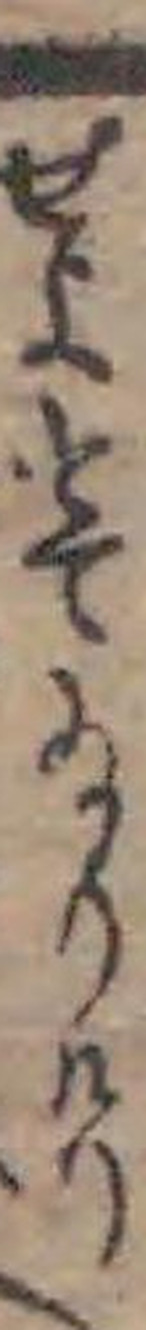せよとて給りけり
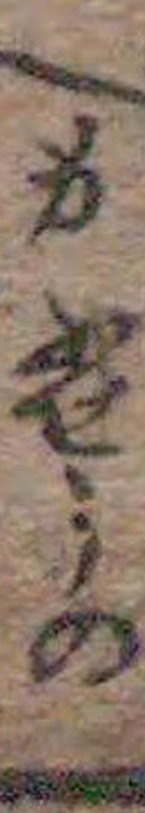身ふせうの
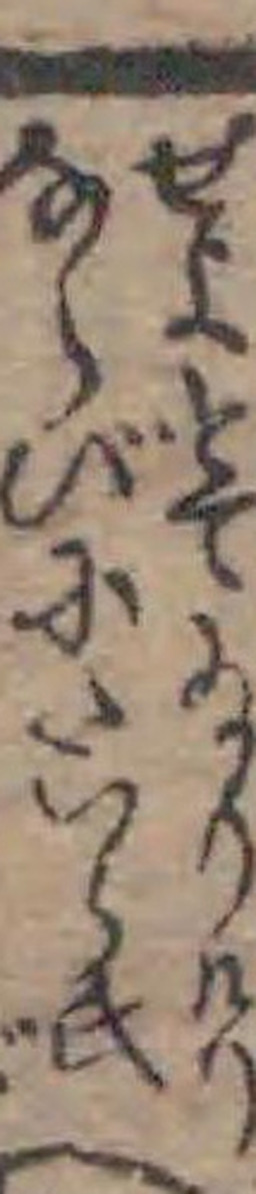ならびにたいら氏
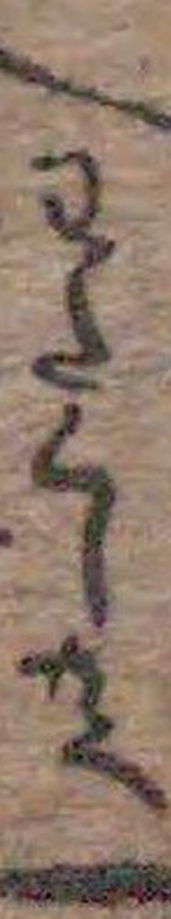わたくし共へ
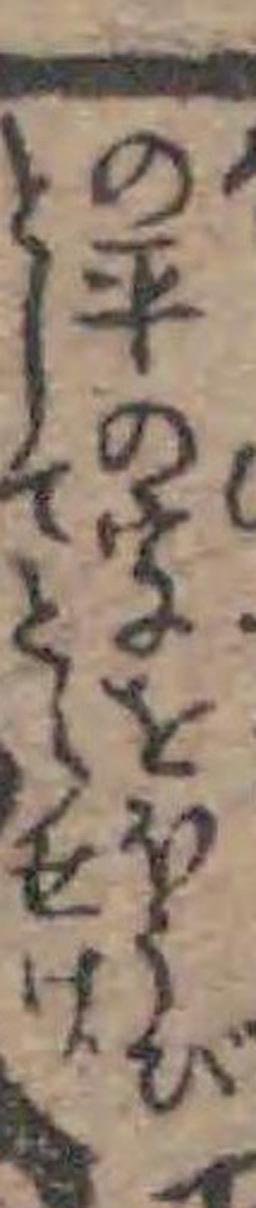としてとらせける
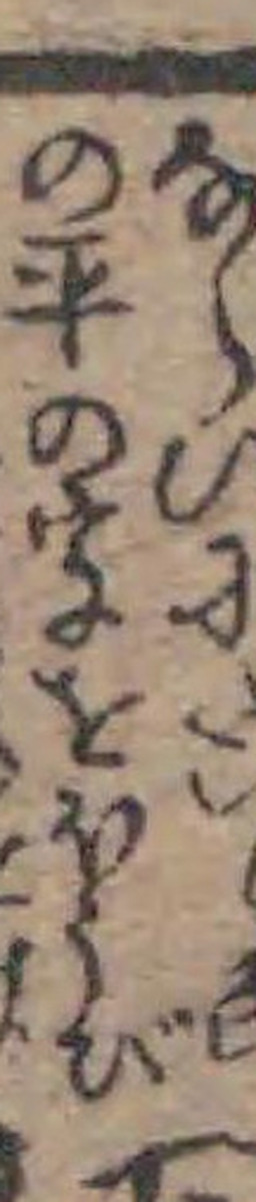の平の字をほうび
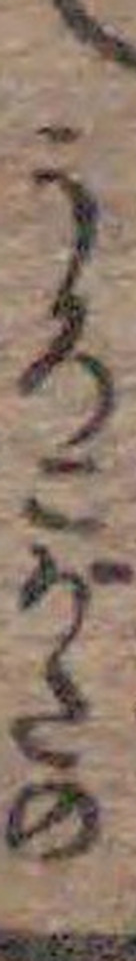うろこがたの
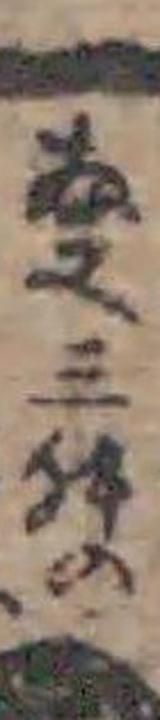扨又三舛の
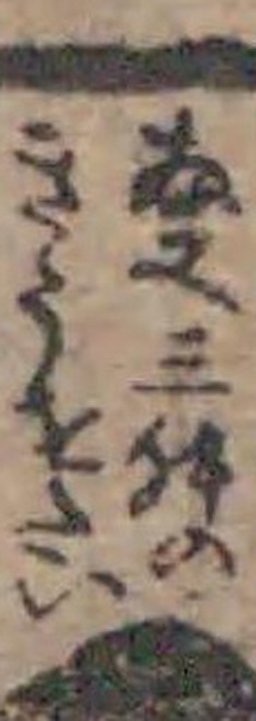きうをたい
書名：三舛増鱗組 : 3巻
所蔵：国立国会図書館 National Diet Library, JAPAN
